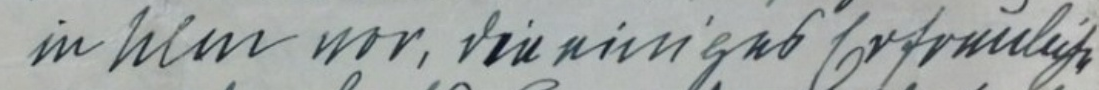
in Ulm vor, die einiges Erfreuliches
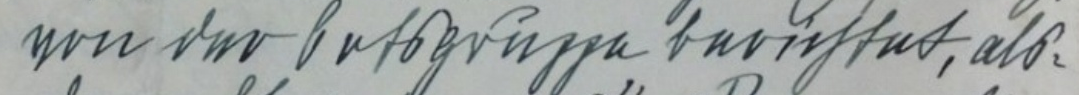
von der Ortsgruppe berichtet, als
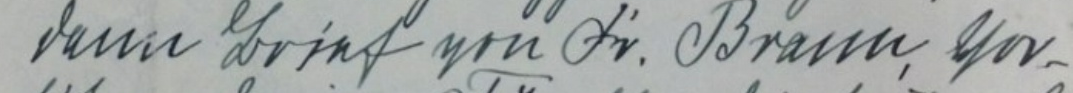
dann Brief von Fr. Braun Vor
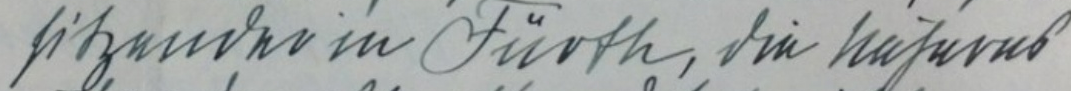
sitzender in Führt, die Näheres
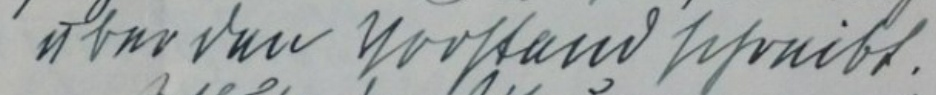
über den Vorstand schreibt.
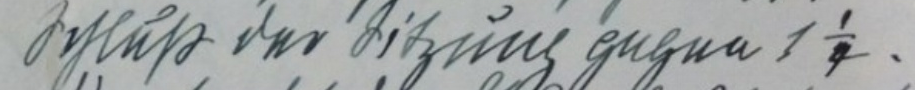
Schluß der Sitzung gegen 1¼.
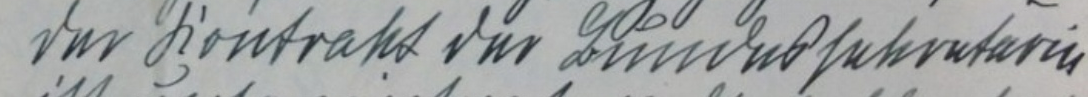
Der Kontrakt der Bundessekretärin
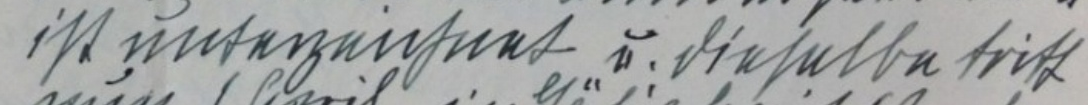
ist unterzeichnet u. dieselbe tritt
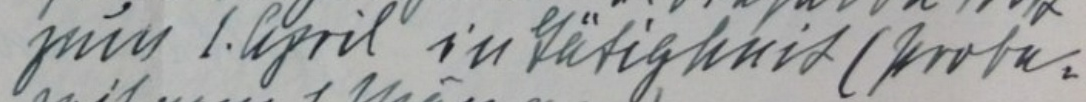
zum 1. April in Tätigkeit (Probe
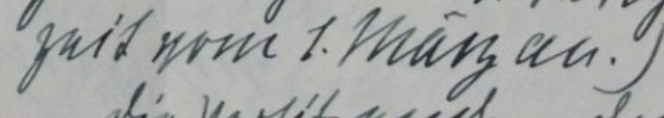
zeit vom 1. März an.
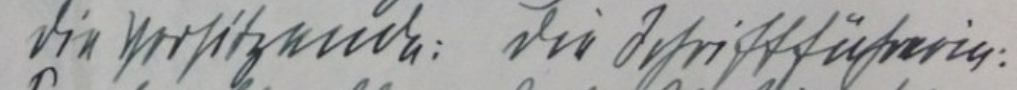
Die Vorsitzende: Die Schriftführerin:
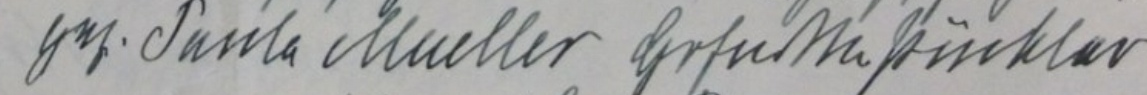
gez: Paula Mueller Grfn. M. Pückler
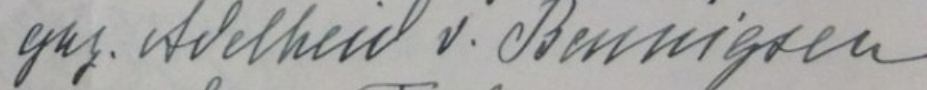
gez. Adelheid v. Bennigsen
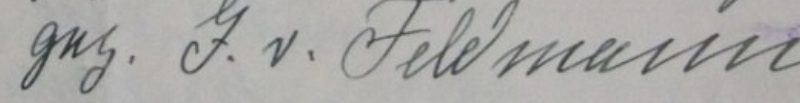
gez. F. v. Feldmann.
